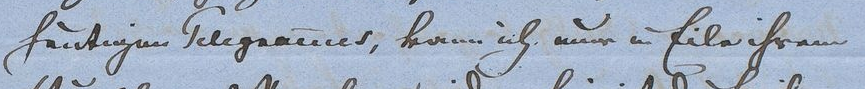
heutigen Telegrammes, kann ich nur in Eile ihrem
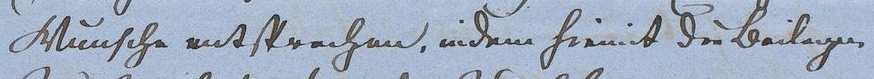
Wunsche entsprechen, indem hiemit die Beilagen
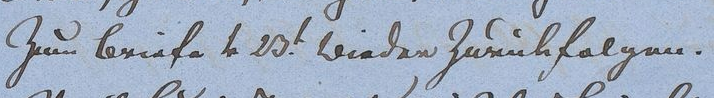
zum Briefe v 23t wieder zurückfolgen. –
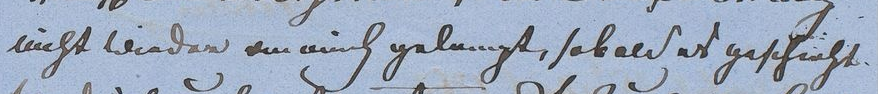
nicht wieder an mich gelangt, sobald es geschieht
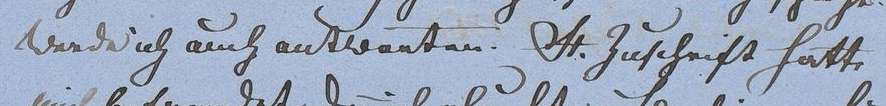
werde ich auch antworten. St. Zuschrift hatte
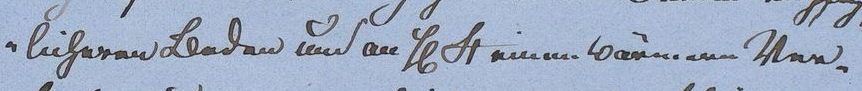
licheren Boden und an Hr St einen wärmeren Ver-
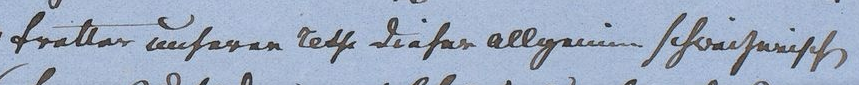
tretter unserer resp. dieser allgemein schweizerischen
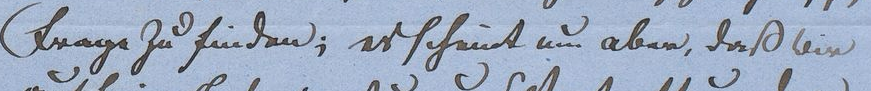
Frage zu finden; es scheint nun aber, daß wir
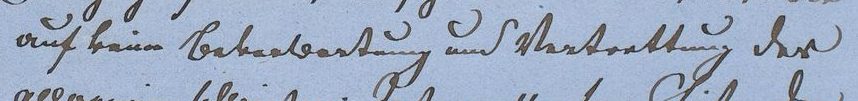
auf keine Bevorwortung und Vertrettung des
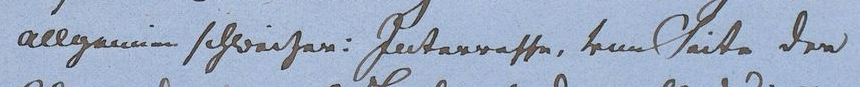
allgemein schweizer: Interessen, von Seite der
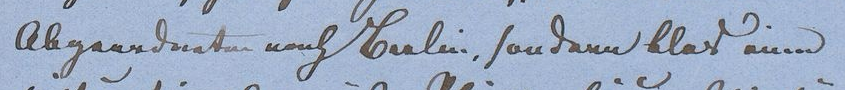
Abgeordneten nach Berlin, sondern blos eine
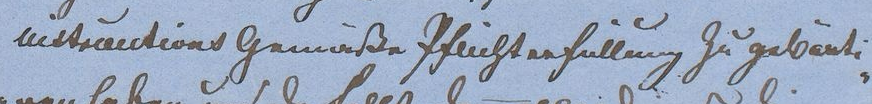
instructionsgemäße Pflichterfüllung zu gewärti-
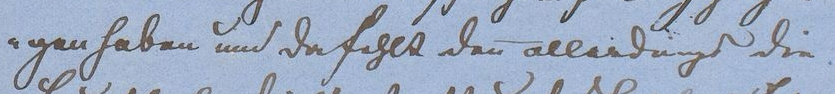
gen haben und da fehlt denn allerdings die
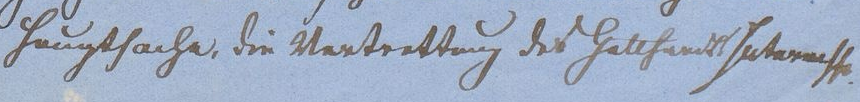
Hauptsache, die Vertrettung der Gotthardt Interessen
